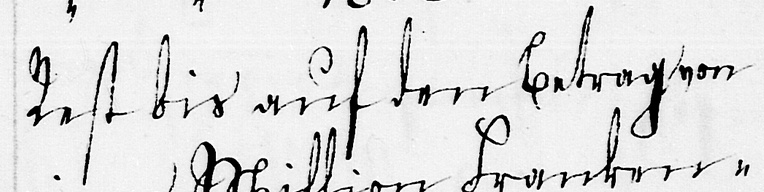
Rest bis auf den Betrag von
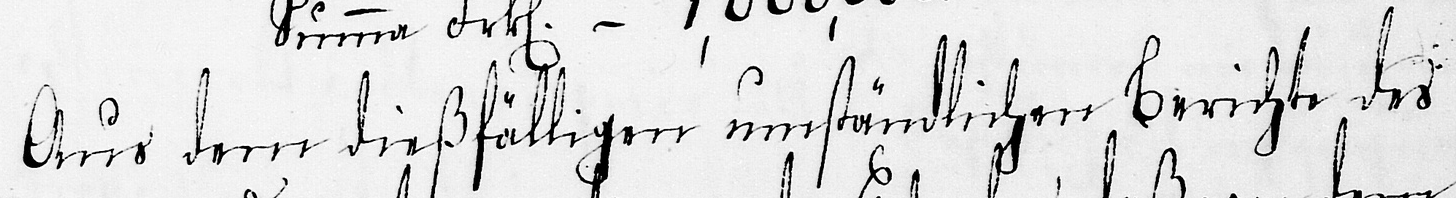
Aus dem dießfälligen umständlichen Berichte des
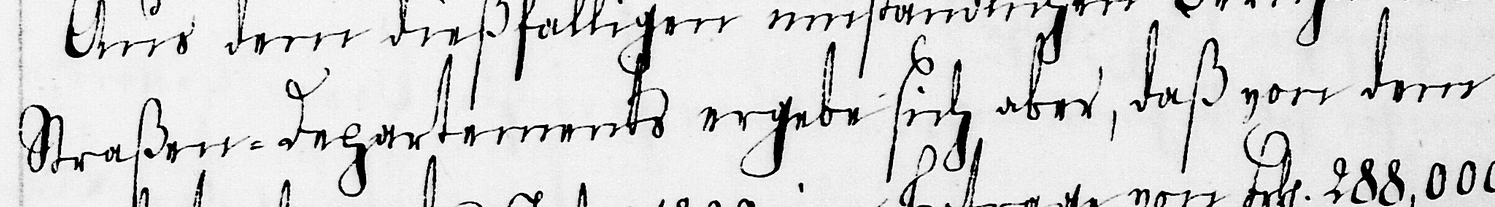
Straßen-Departements ergebe sich aber, daß von dem
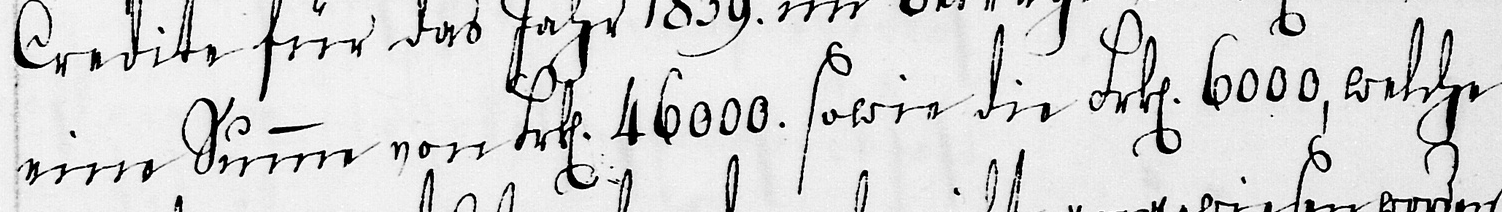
eine Summe von Frk[en]. 46 000. sowie die Frk[en]. 6000, welche
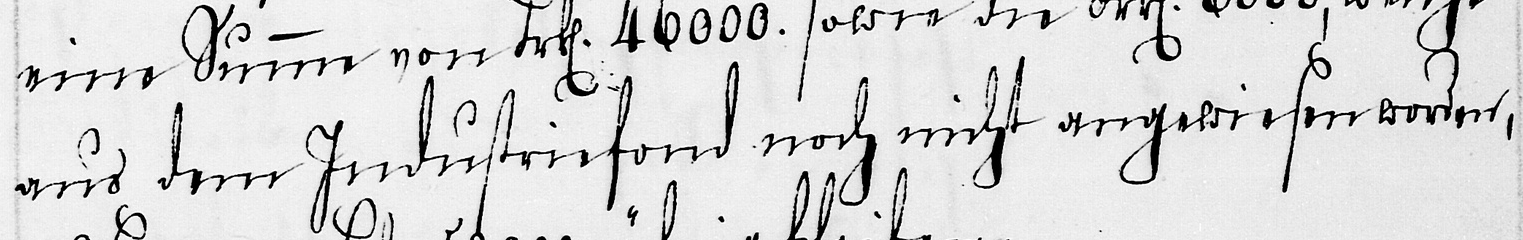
aus dem Industriefond noch nicht angewiesen worden,
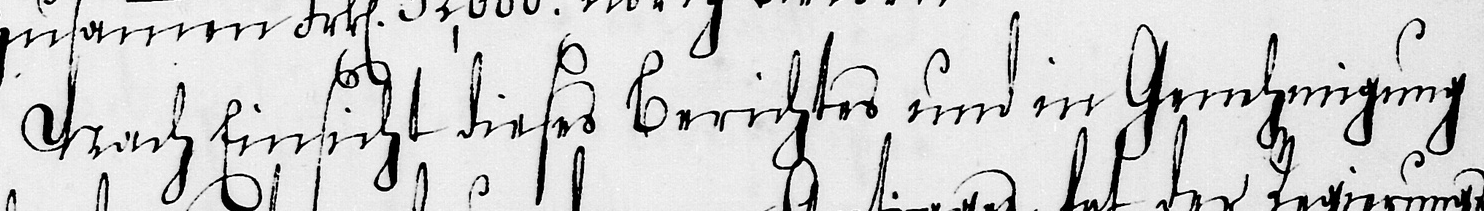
Nach Einsicht dieses Berichtes und in Genehmigung
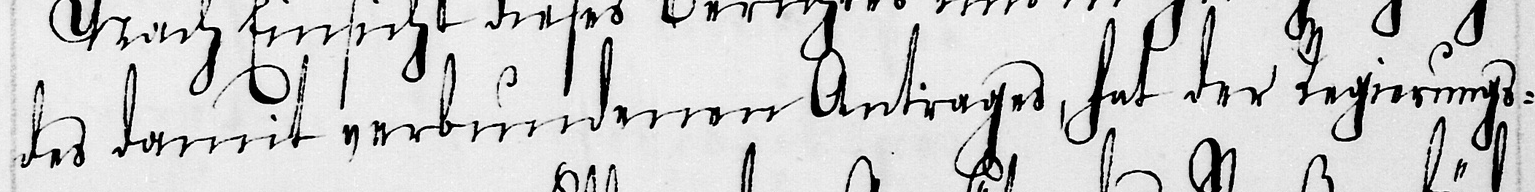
des damit verbundenen Antrages, hat der Regierungs¬
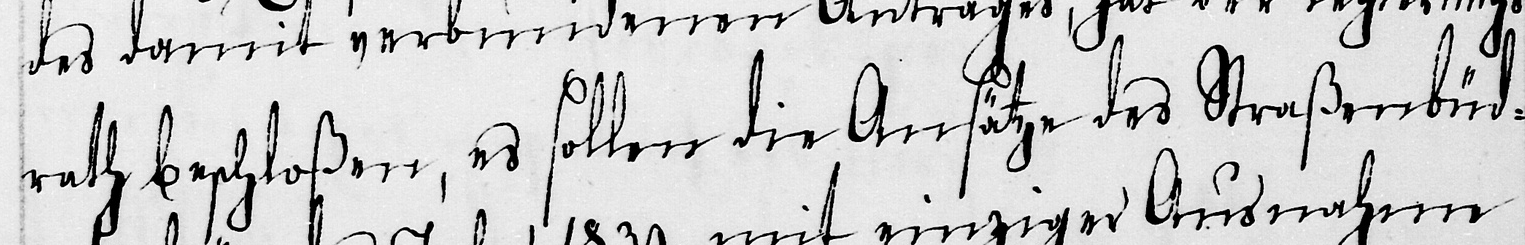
rath beschloßen, es sollen die Ansätze des Straßenbüd¬
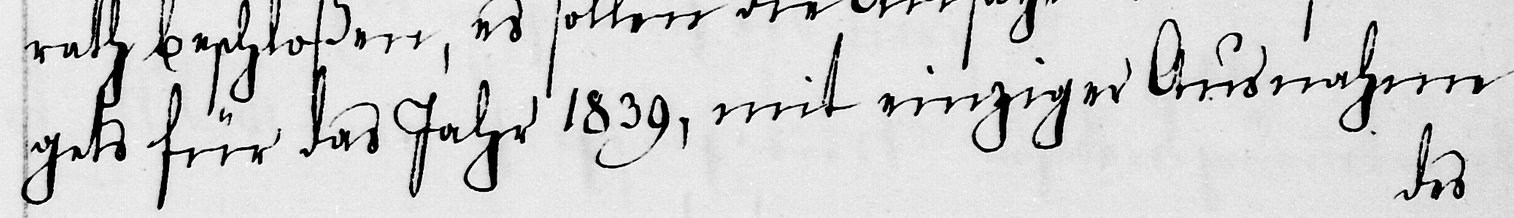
gets für das Jahr 1839, mit einziger Ausnahme
